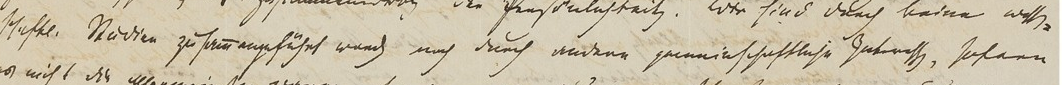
schaftl. Studien zusammengeführt worden noch durch andere gemeinschaftliche Interessen, sofern
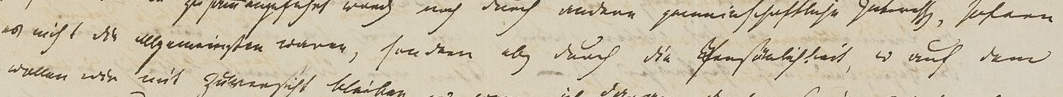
es nicht die allgemeinsten waren, sondern eben durch die Persönlichkeit, u auf dem
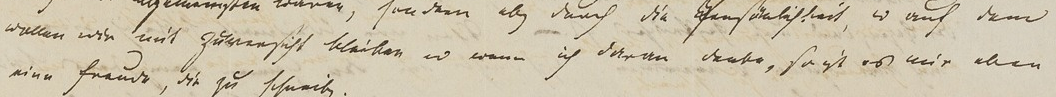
wollen wir mit Zuversicht bleiben u wenn ich daran denke, so ist es mir eben
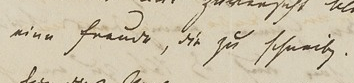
eine Freude, dir zu schreiben.
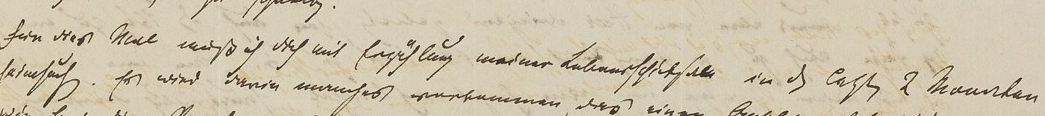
Für dies Mal muß ich dich mit Erzählung meiner Lebensschicksale in den letzten 2 Monaten
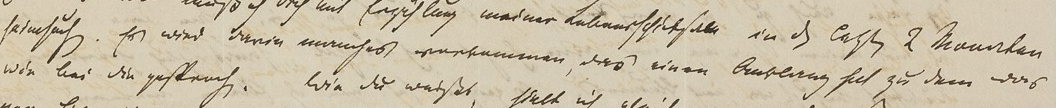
heimsuchen. Es wird darin manches vorkommen, das einen Anklang hat zu dem was
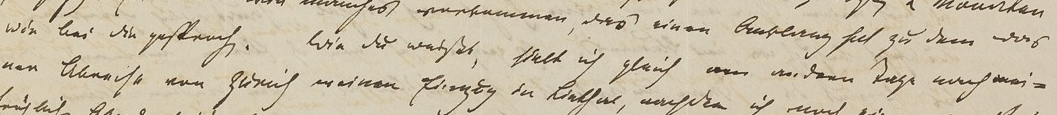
wir bei dir gesprochen. Wie du weißt, hielt ich gleich am andern Tage nach mei-
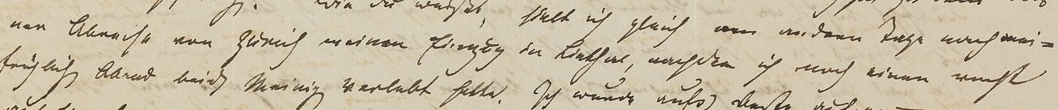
ner Abreise von Zürich meinen Einzug in Linthal, nachdem ich noch einen recht
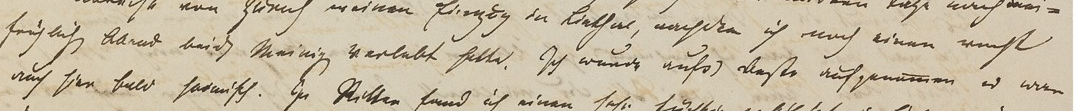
fröhlichen Abend bei den Meinigen verlebt hatte. Ich wurde auf's beste aufgenommen u war
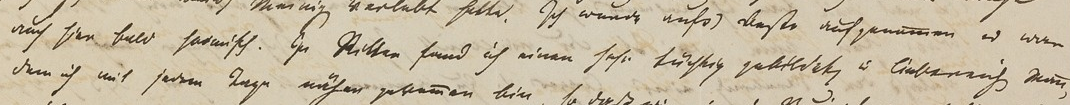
auch hier bald heimisch. In Ritter fand ich einen sehr tüchtig gebildeten u liebereichen Mann,
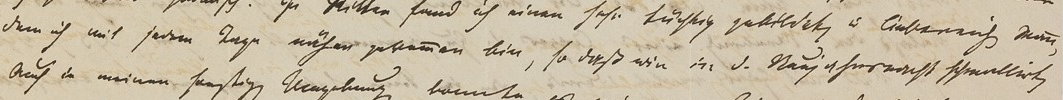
dem ich mit jedem Tage näher gekommen bin, so daß wir in d. Neujahrsnacht schmollirten.
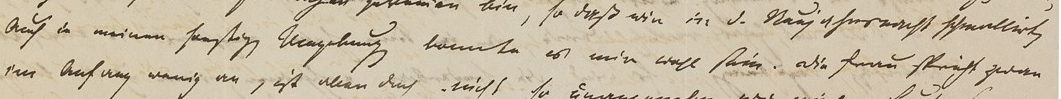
Auch in meinen sonstigen Umgebungen konnte es mir wohl sein. Die Frau spricht zwar
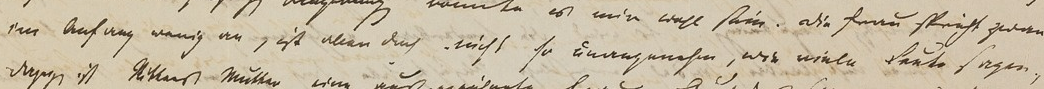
im Anfang wenig an, ist aber doch nicht so unangenehm, wie viele Leute sagen,
